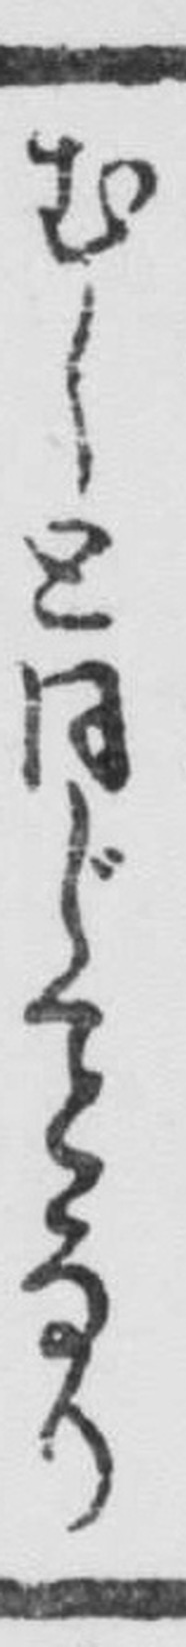むしと同じことなり
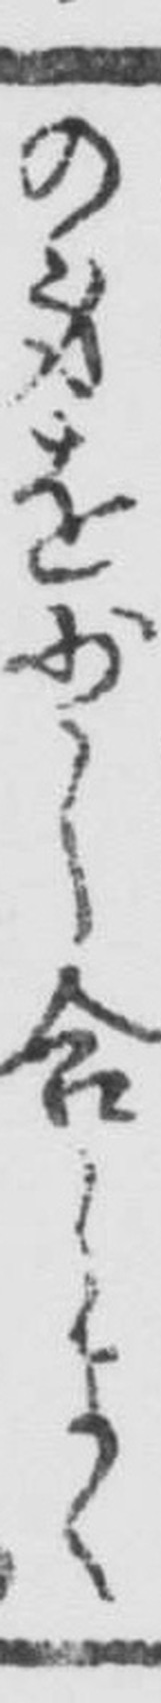の身を少し合しよく
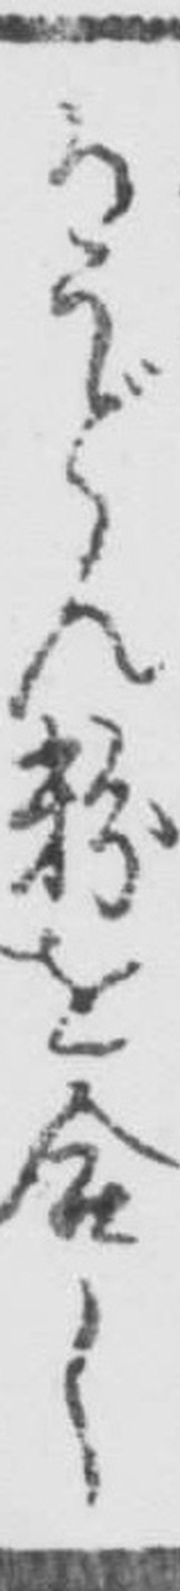かうどん粉を合し
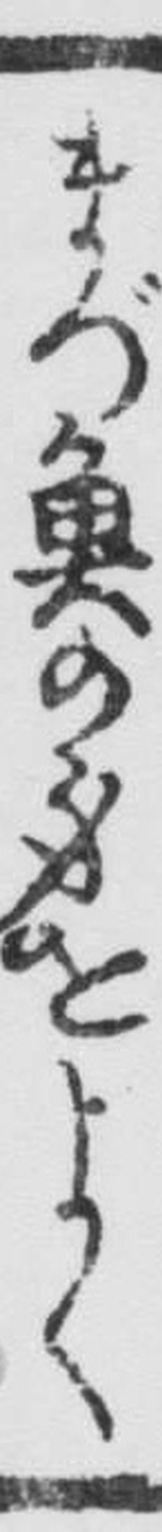まづ魚の身をよく
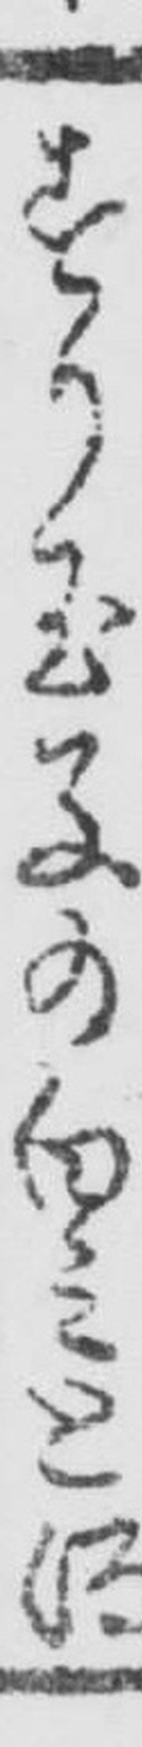すり玉子の白身と酒
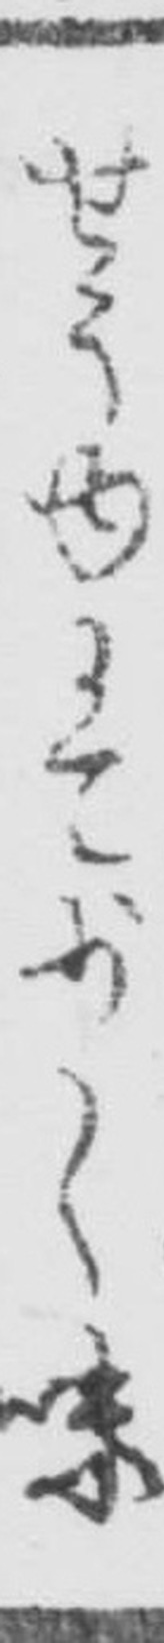せうゆにて少し味
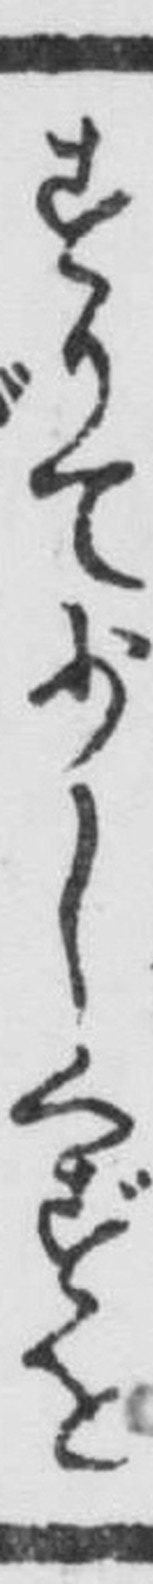すりて少しくずを
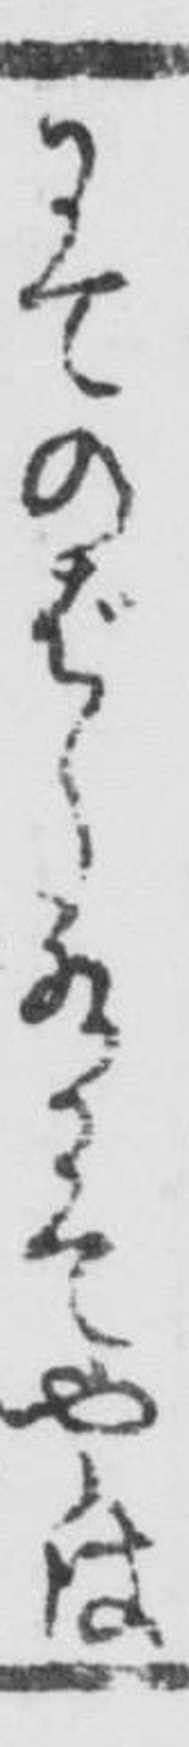にてのばし水にてやは
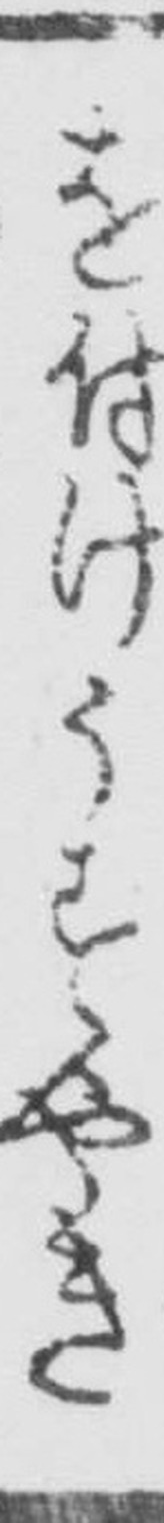を付けうすやき
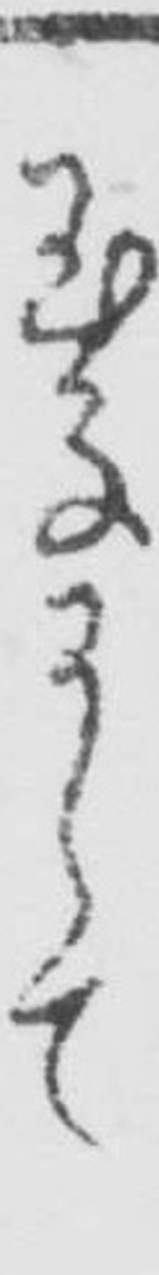玉子にして
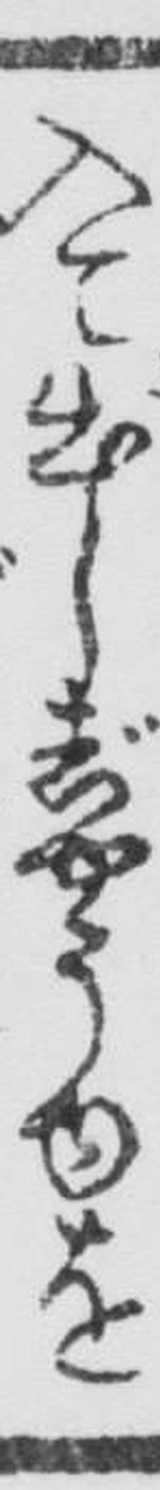入て出しじやうゆを
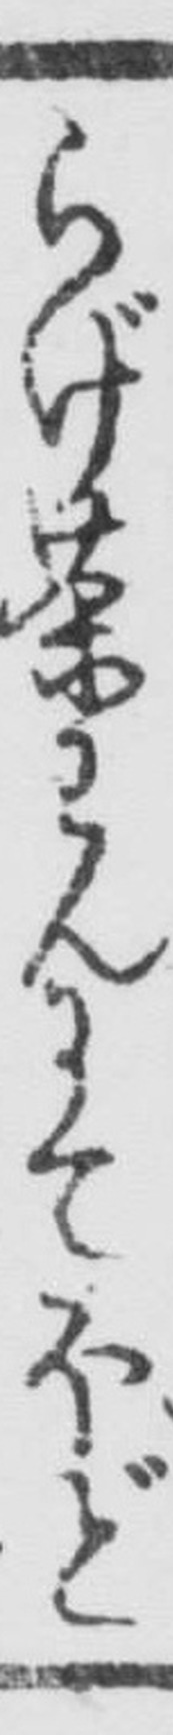らげ茶わんにてほど
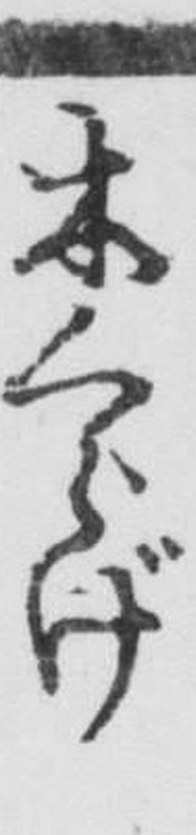木くらげ
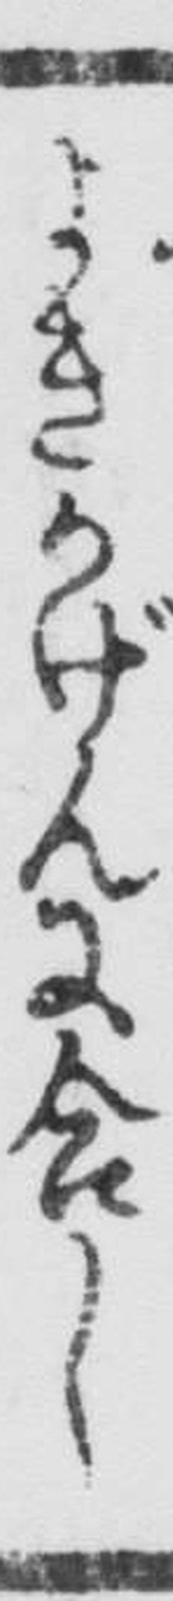よきかげんに合し
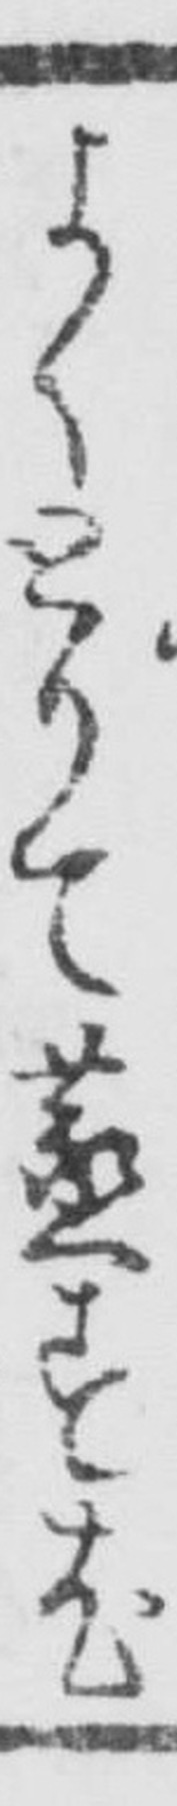よくとりて蒸す尤
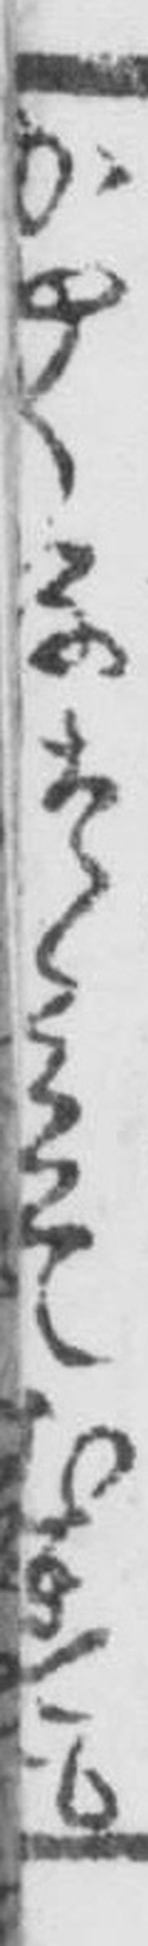かやく拵つゝみてむすも
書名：諸家通用/即席料理
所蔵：大阪府立大学学術情報センター 国文学研究資料館
